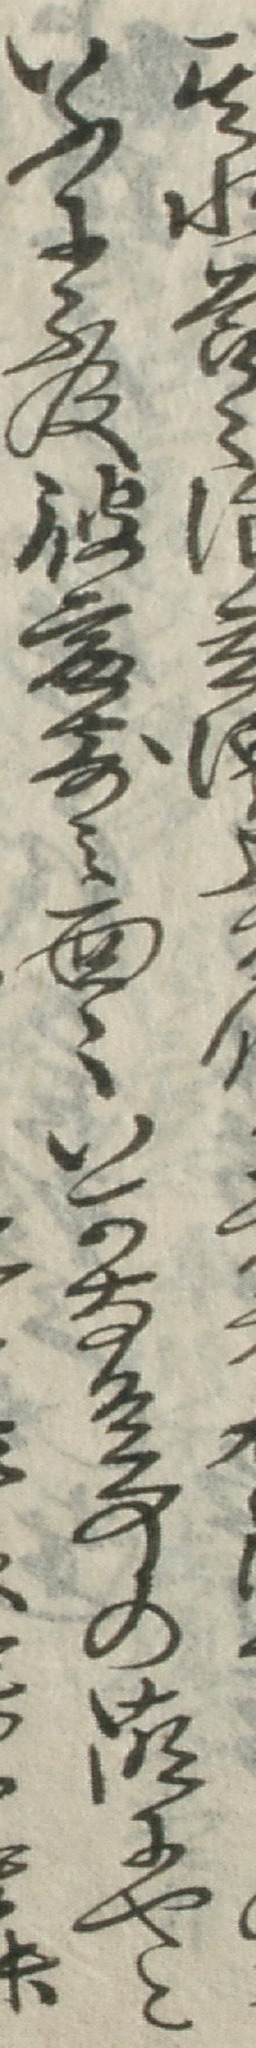いふに不及彼最寄之面々いかなる事の浪にやと
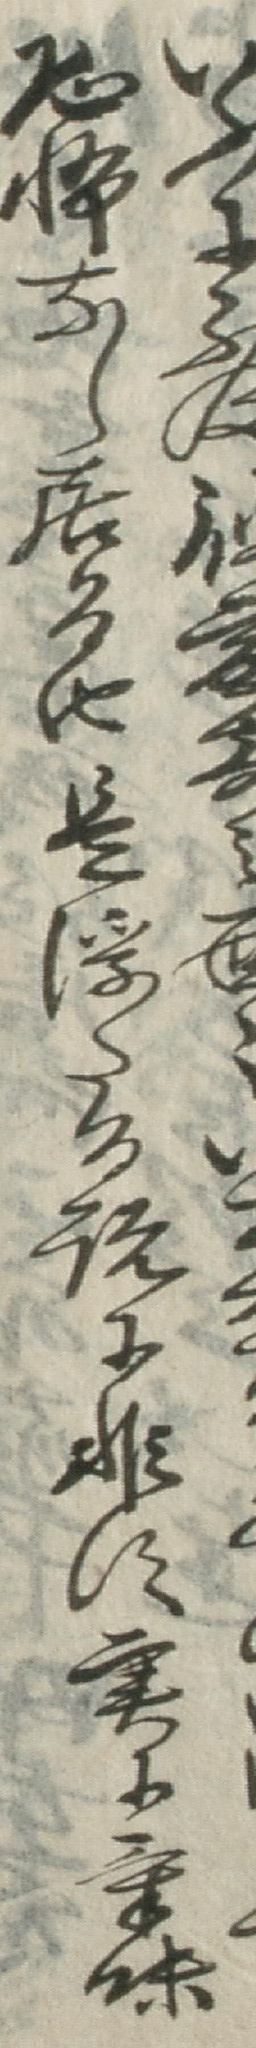恐怖なし居る由是浮たる説二非す実に気味
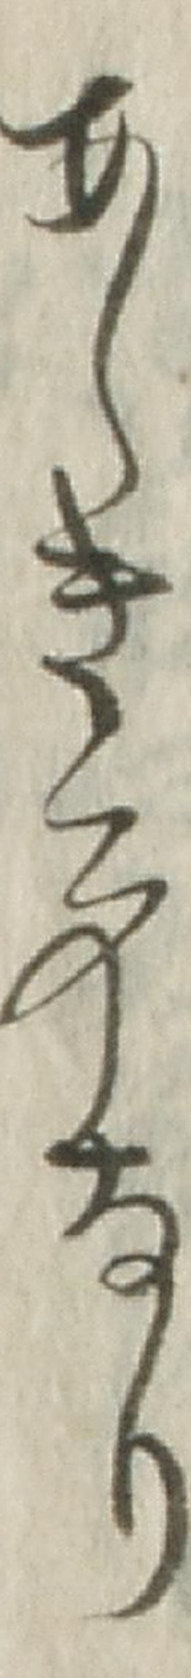あしきことなり
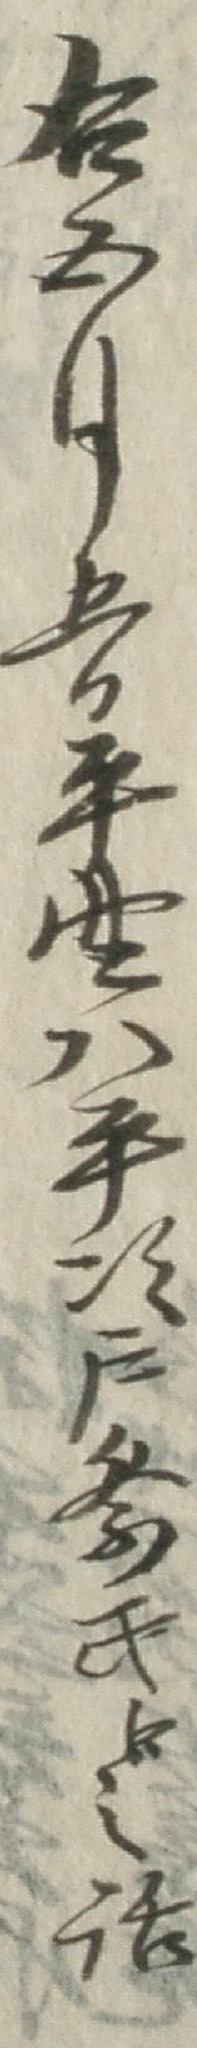右五月五日平野八平次戸祭氏江之話
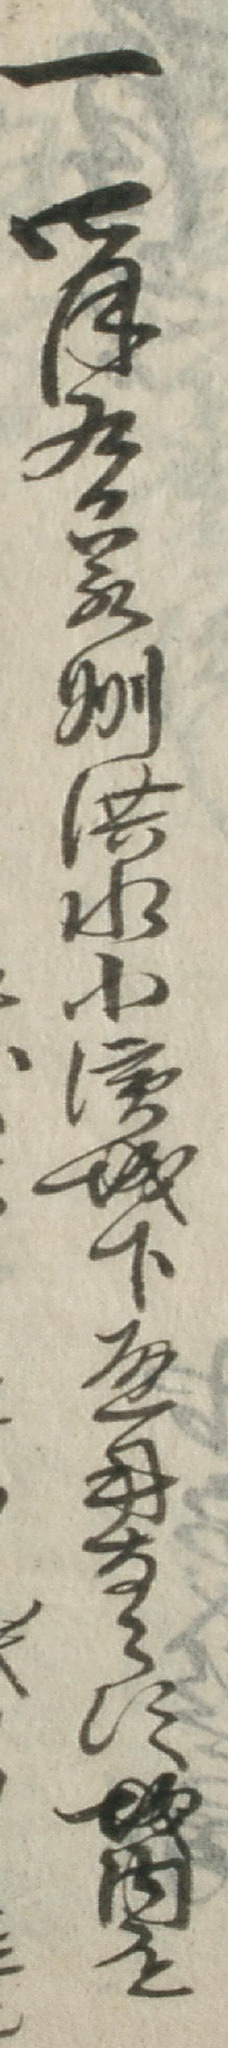一四月九日若州洪水小浜城下通用ならす城内を
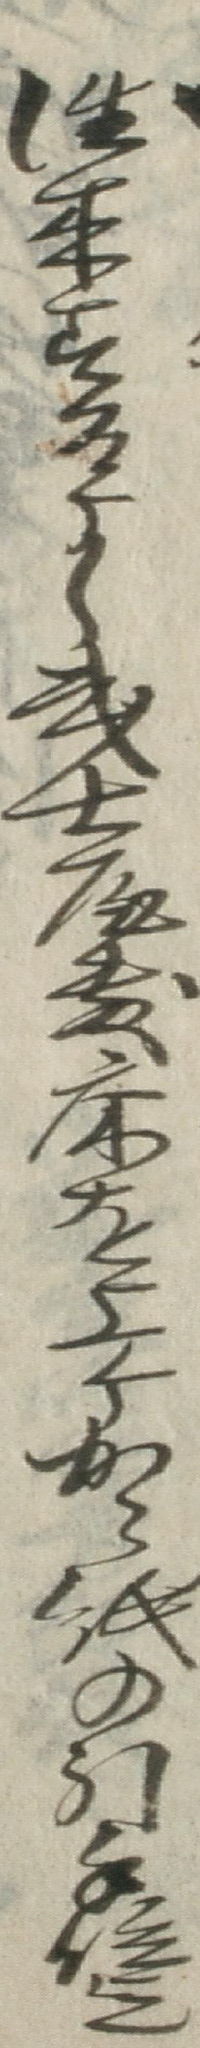往来するよし武士屋敷床を上ヶから紙の引手位迄
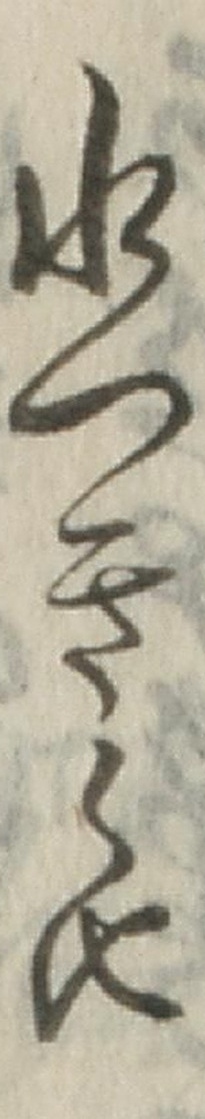水つき候由
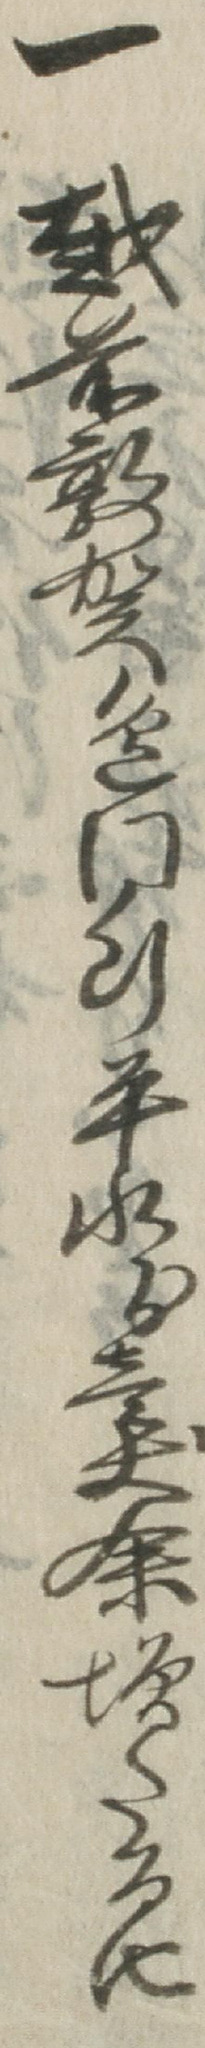一越前敦賀辺同断平水ゟ壱丈余増たる由
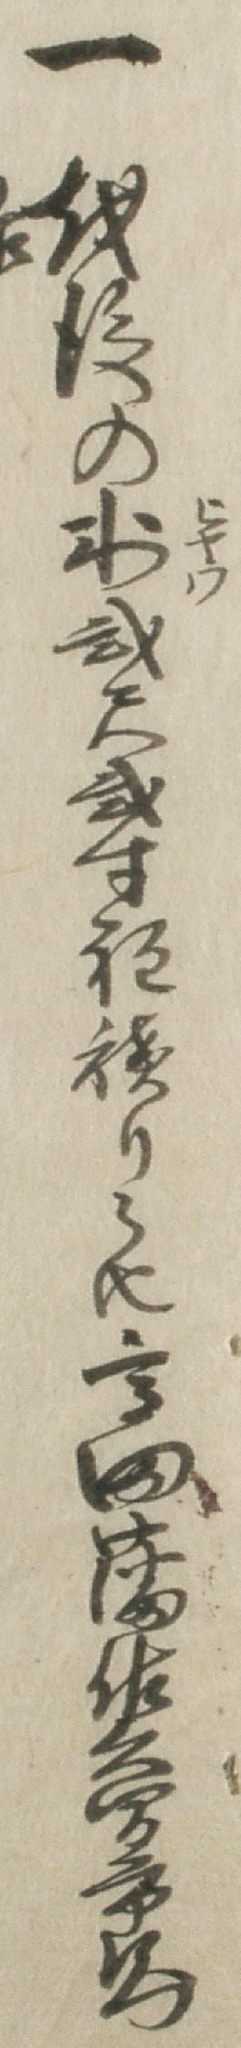一越後の氷弐尺程積り候由高田藩佐久間市右衛門
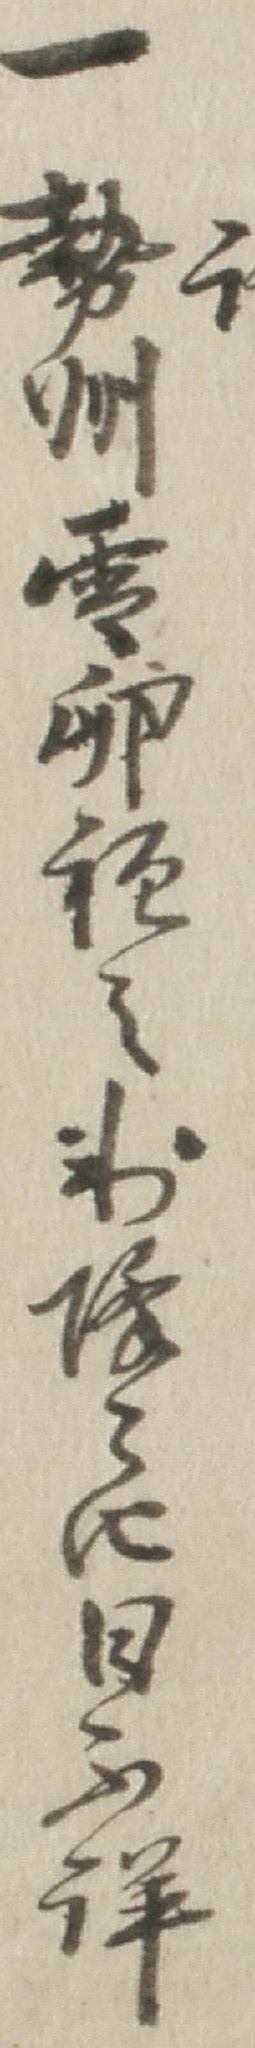一勢州雲卵程之氷降候由日不詳
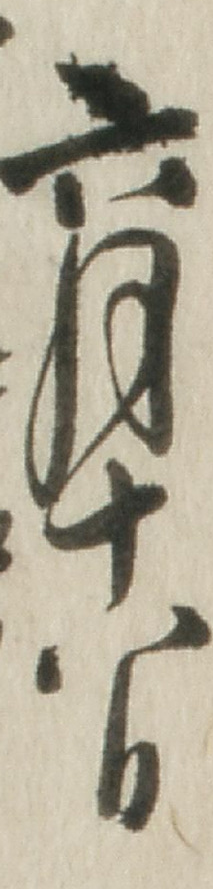六月十八日
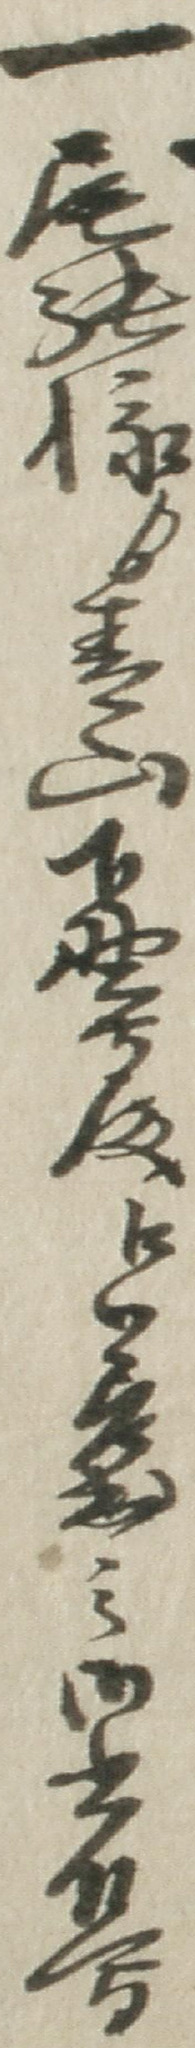一尾張様ゟ青山下野守殿江御差出之御書付写
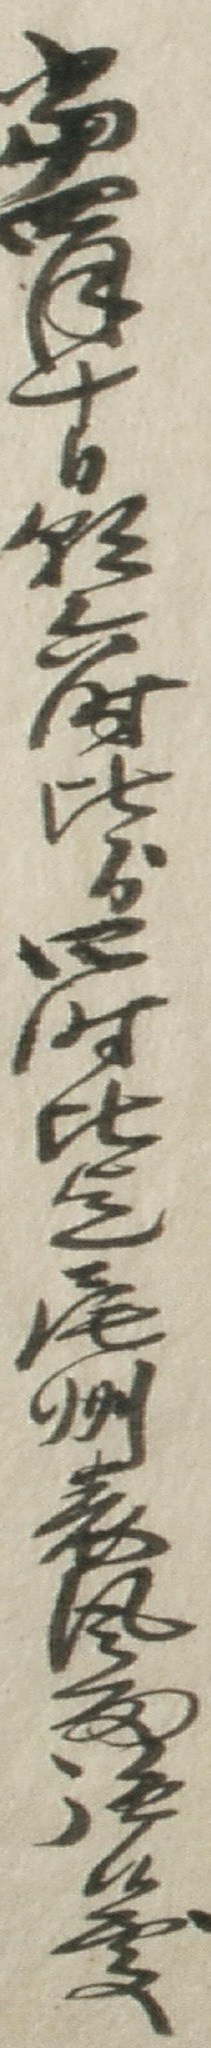当四月十日朝六時比ゟ四時比迄尾州表風雨強候処
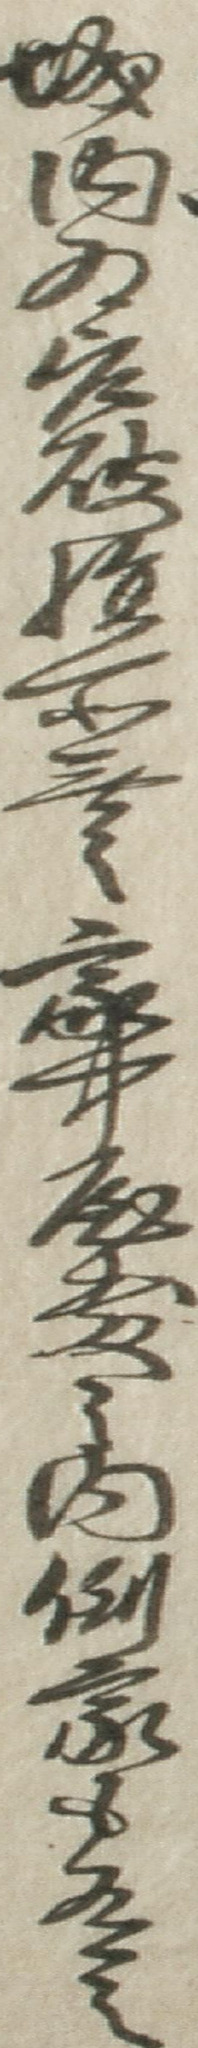城内為差破損所無之家中屋敷之内倒家も有之
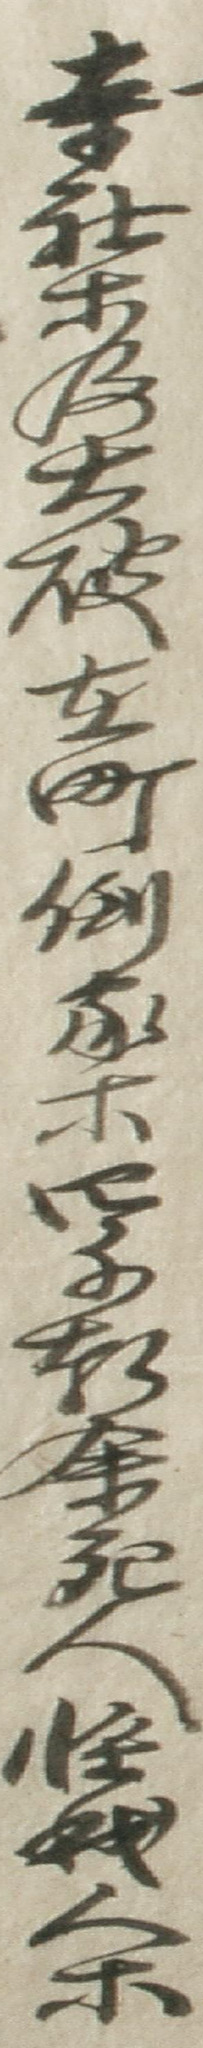寺社等及大破在町倒家等四千軒余死人怪我人等
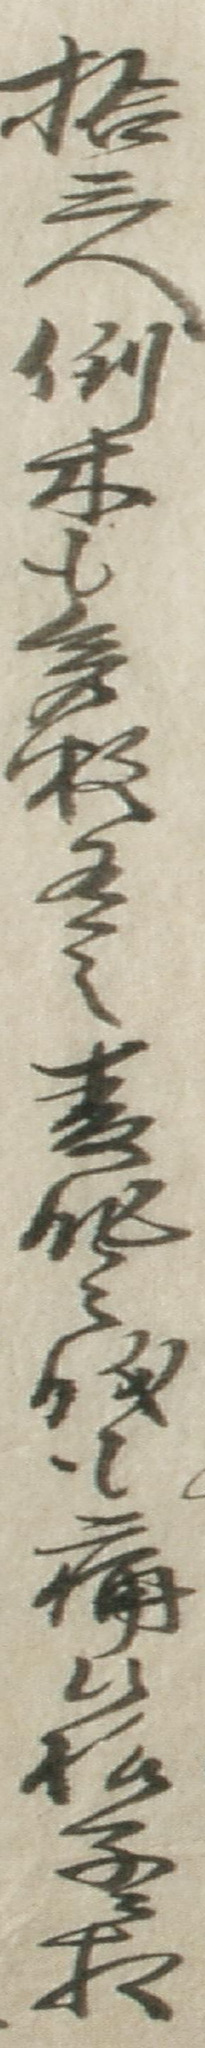拾三人倒木も多数有之麦作之儀も痛候様子二相
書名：信濃國地震實録記
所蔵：東京大学地震研究所図書室 Earthquake Research Institute Library, The University of Tokyo, JAPAN
